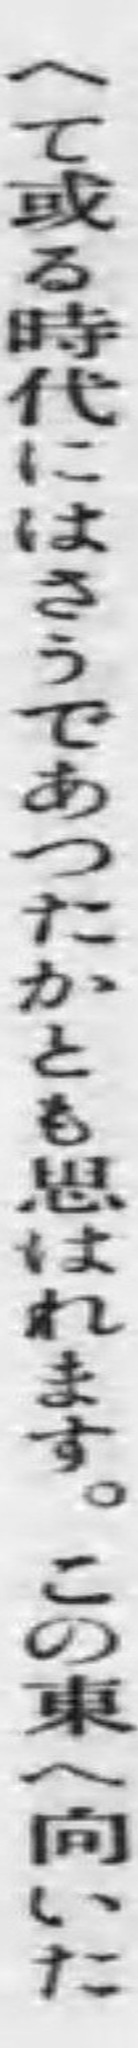へて或る時代にはさうであつたかとも思はれます。この東へ向いた
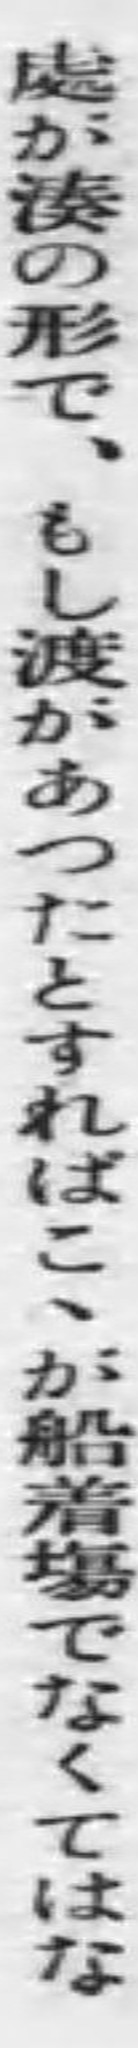処が湊の形で、もし渡があつたとすればこゝが船着場でなくてはな
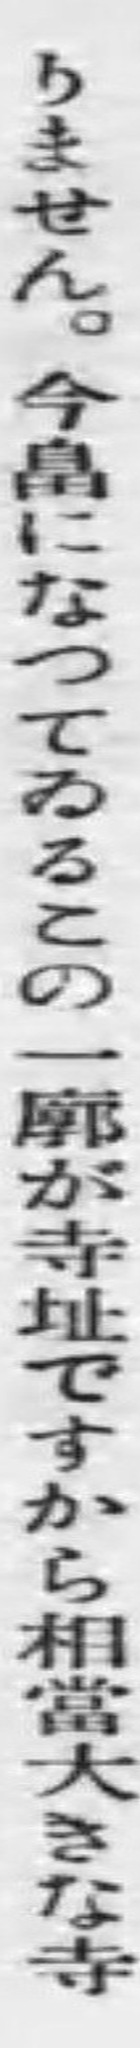りません。今畠になつてゐるこの一廓が寺址ですから相当大きな寺
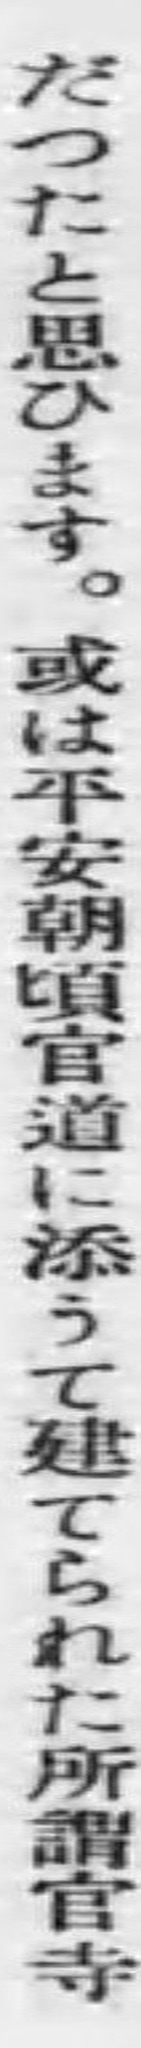だつたと思ひます。或は平安朝頃官道に添うて建てられた所謂官寺
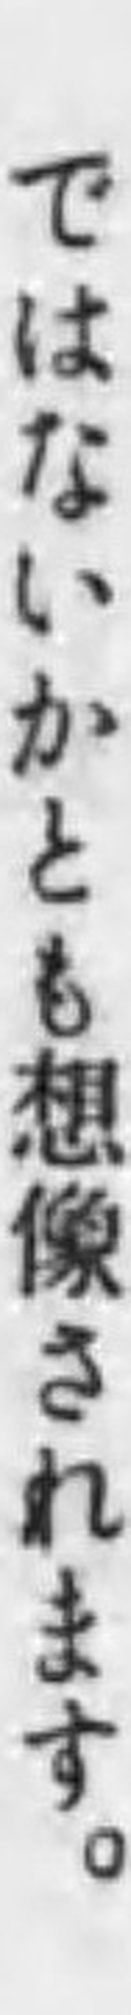ではないかとも想像されます。
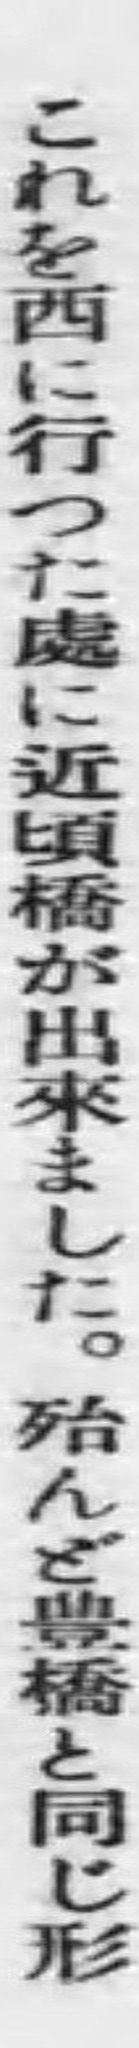これを西に行つた処に近頃橋が出来ました。殆んど豊橋と同じ形
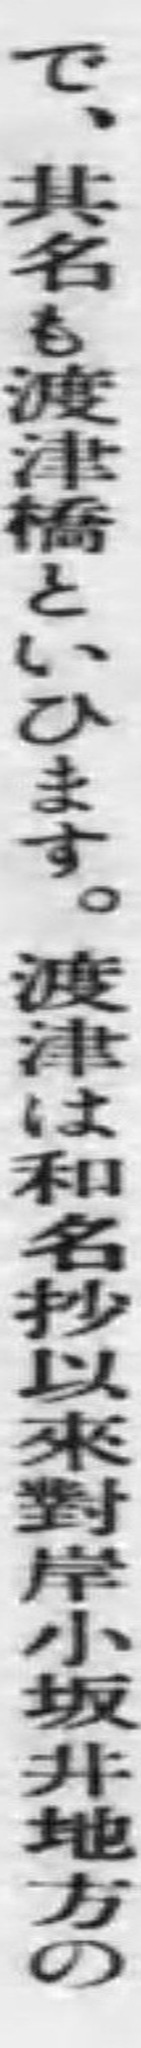で、其名も渡津橋といひます。渡津は和名抄以来対岸小坂井地方の
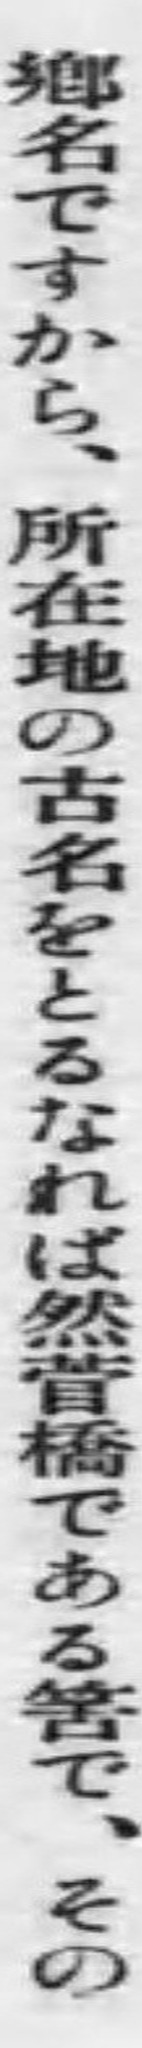郷名ですから、所在地の古名をとるなれば然菅橋である筈で、その
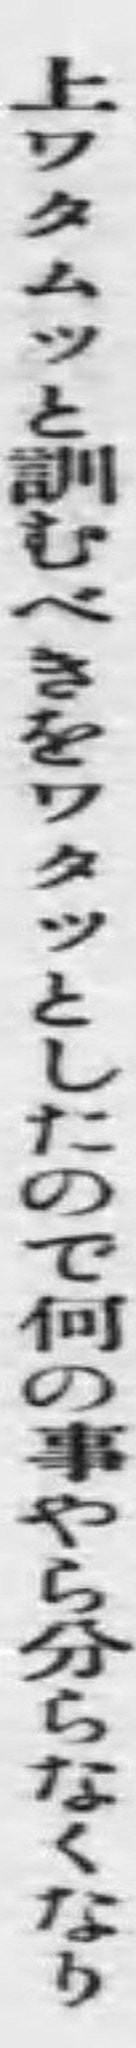上ワタムツと訓むべきをワタツとしたので何の事やら分らなくなり
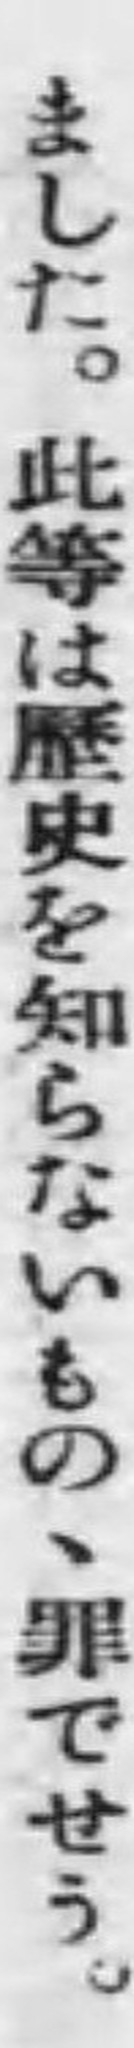ました。此等は歴史を知らないものゝ罪でせう。
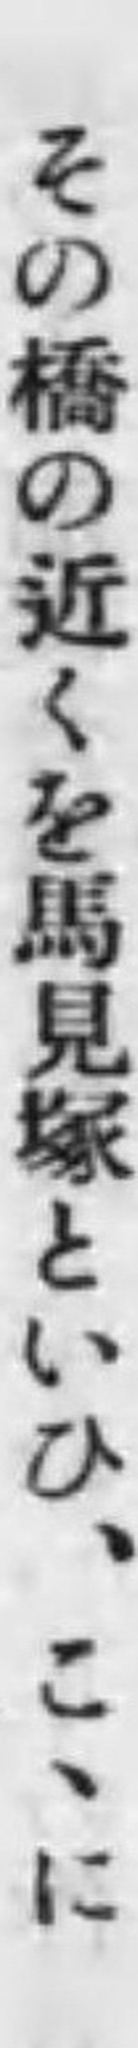その橋の近くを馬見塚といひ、こゝに
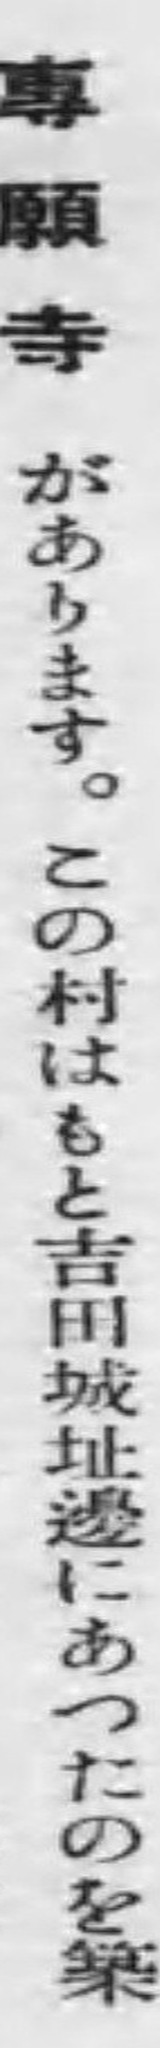専願寺があります。この村はもと吉田城址辺にあつたのを築
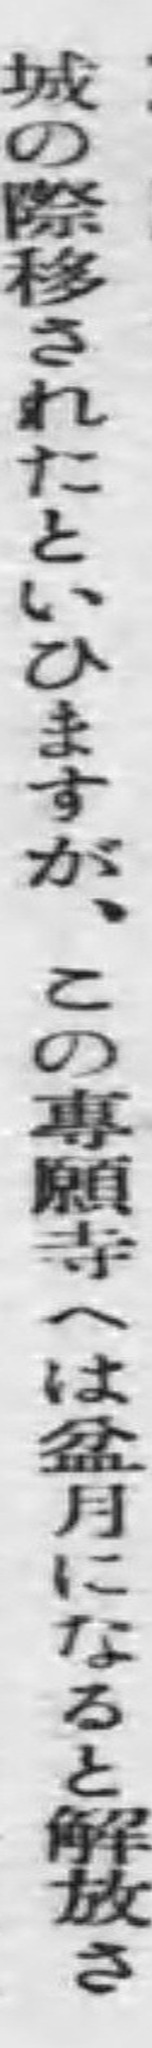城の際移されたといひますが、この専願寺へは盆月になると解放さ
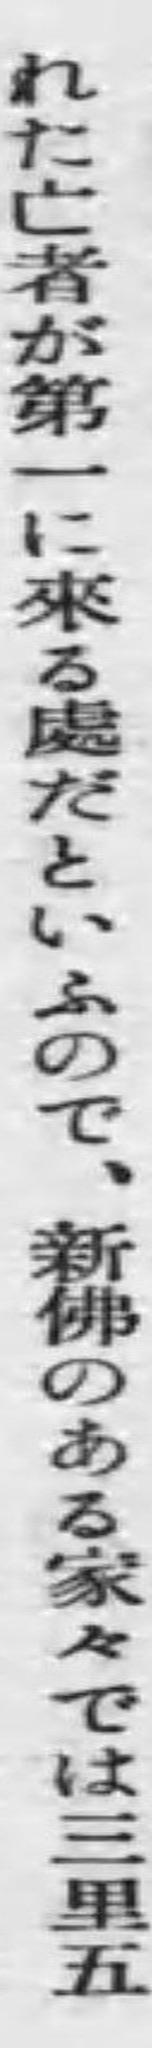れた亡者が第一に来る処だといふので、新仏のある家々では三里五
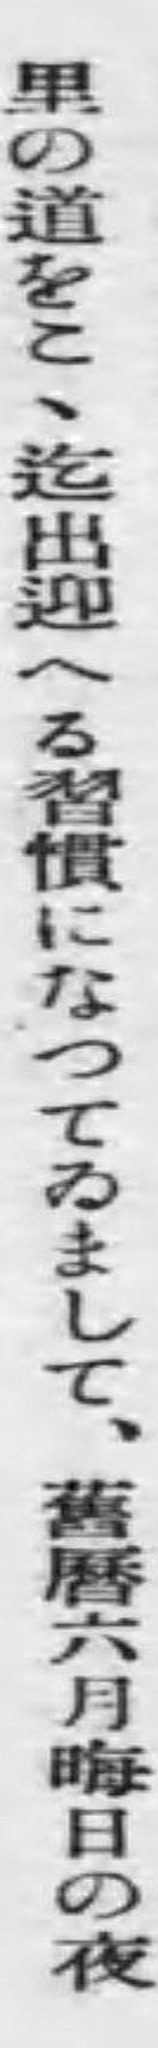里の道をこゝ迄出迎へる習慣になつてゐまして、旧暦六月晦日の夜
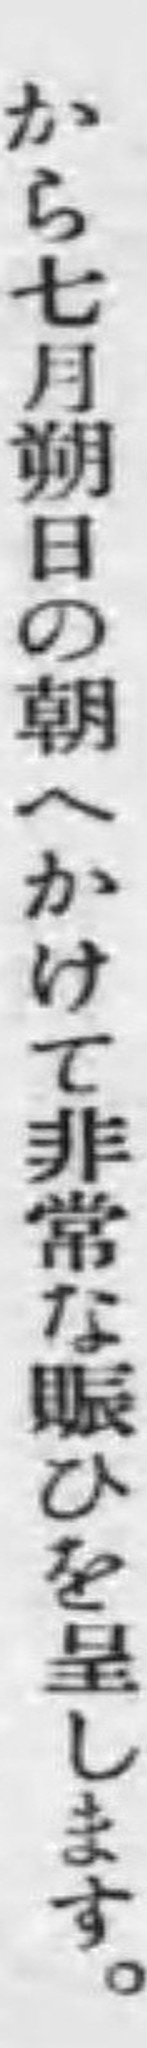から七月朔日の朝へかけて非常な賑ひを呈します。
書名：東三河道中記 : 豊橋市及其附近案内
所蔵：国立国会図書館 National Diet Library, JAPAN
